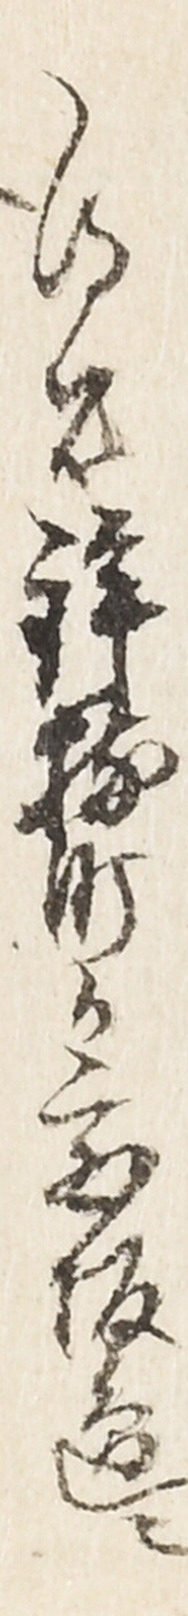候得共鋒持町候宮坂辺に
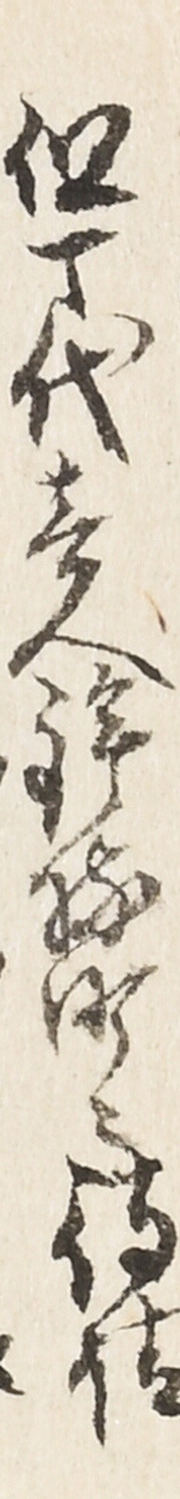但丁代壱人鉾持町々ニ待請
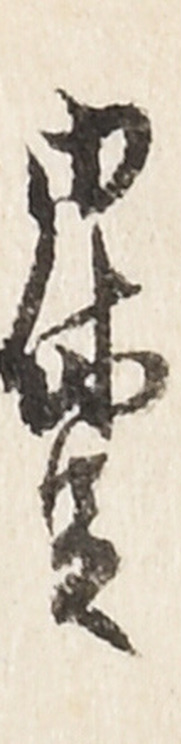御休足
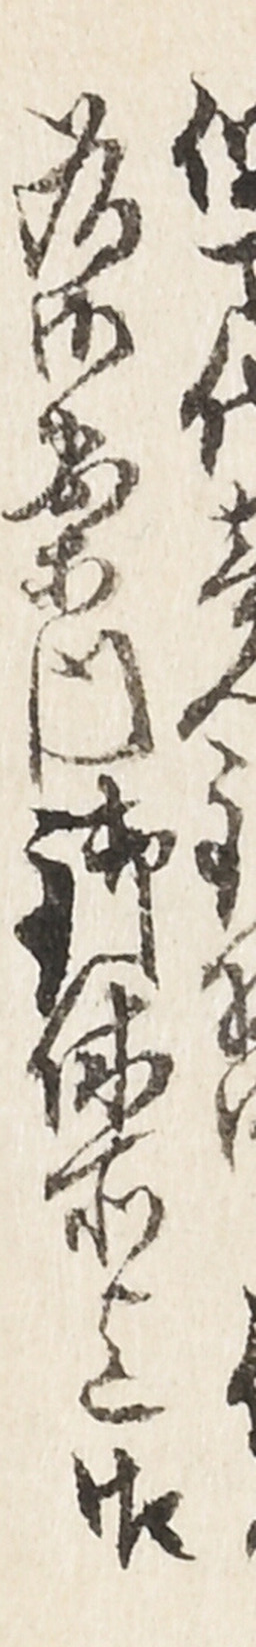為御案内御休所迄御
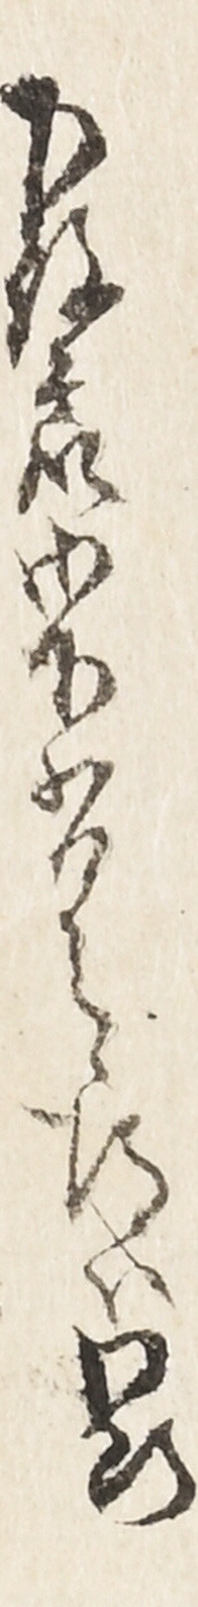下役節御下有之候得ハ同断
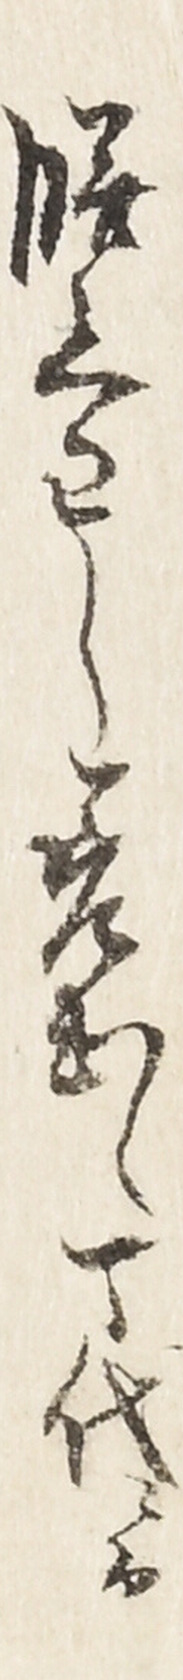餅くわし差出候丁代ニ而
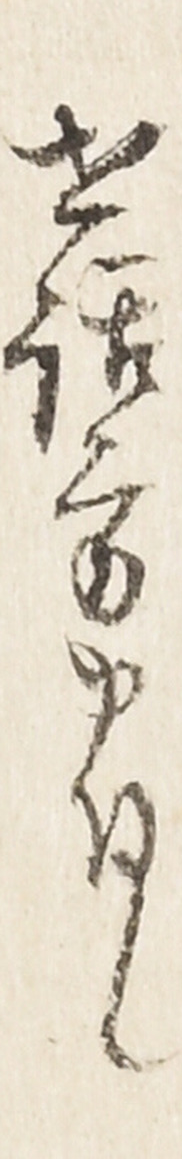世話方申付候
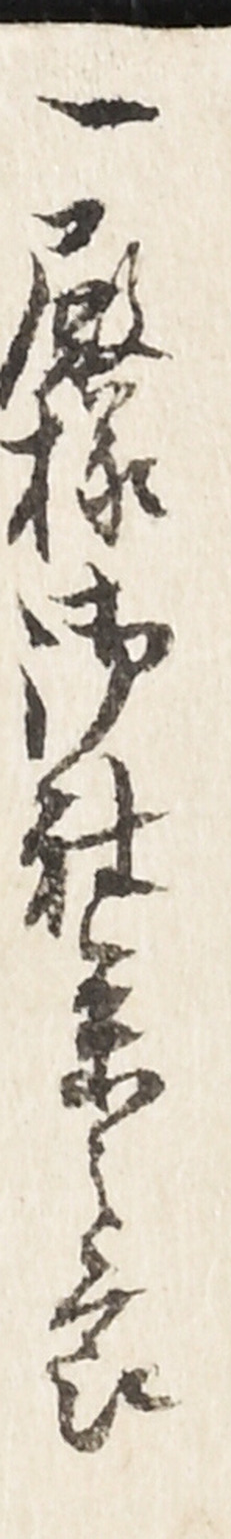一殿様御社参之節
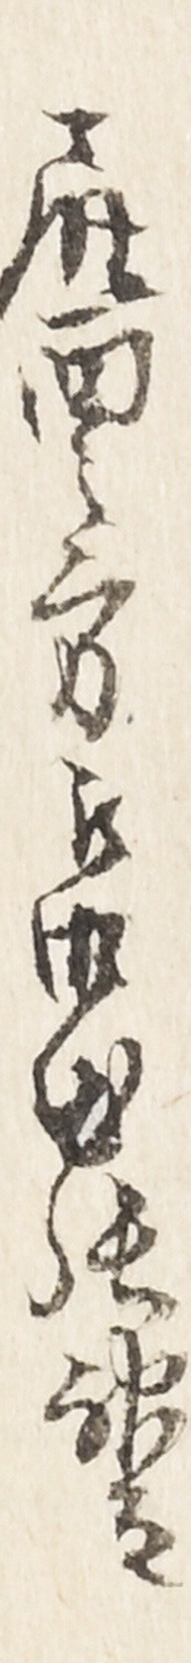尻面之方被御出張神主
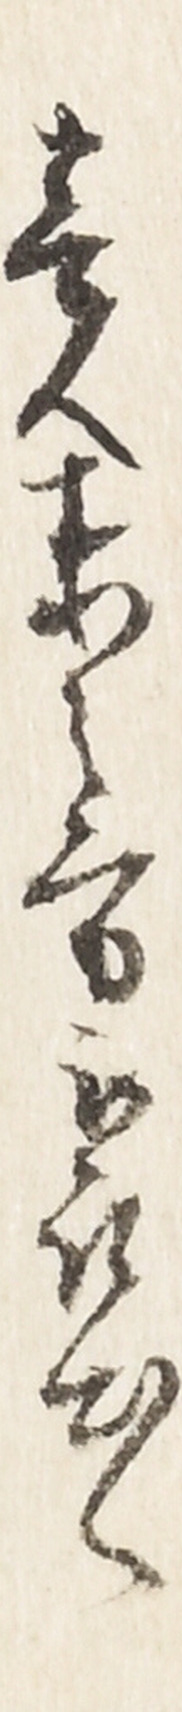壱人末之方被罷出候
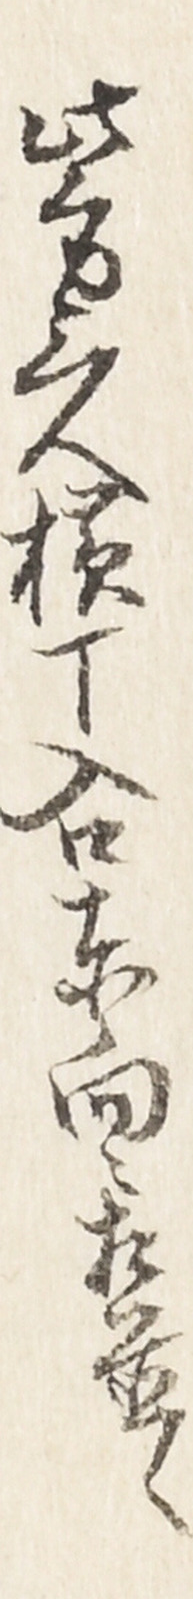此方三人横丁入口東向相並候
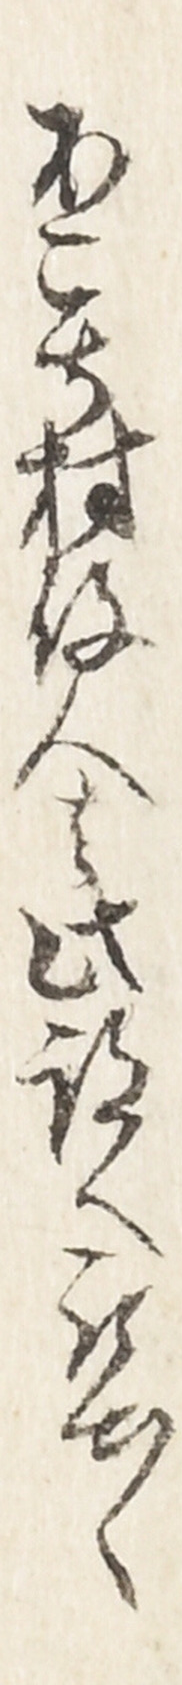ほこち村役人は此跡へ罷出候
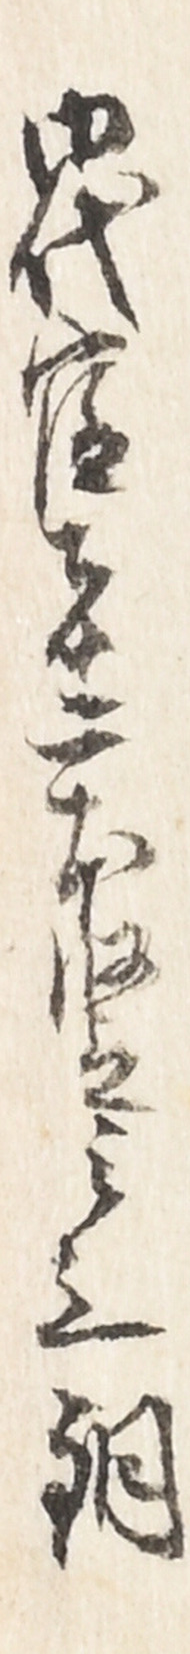御代官竿二本竪之上銅

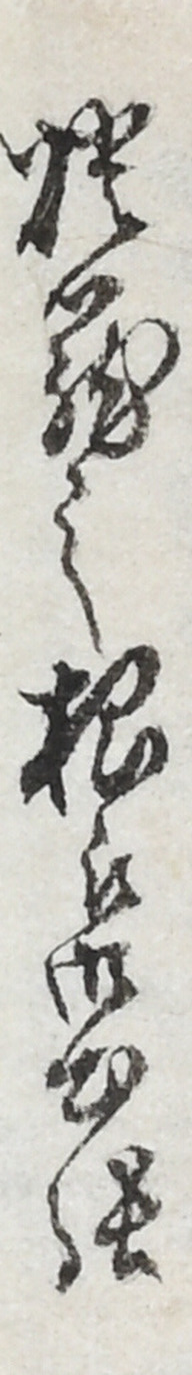燈籠之根え御出張
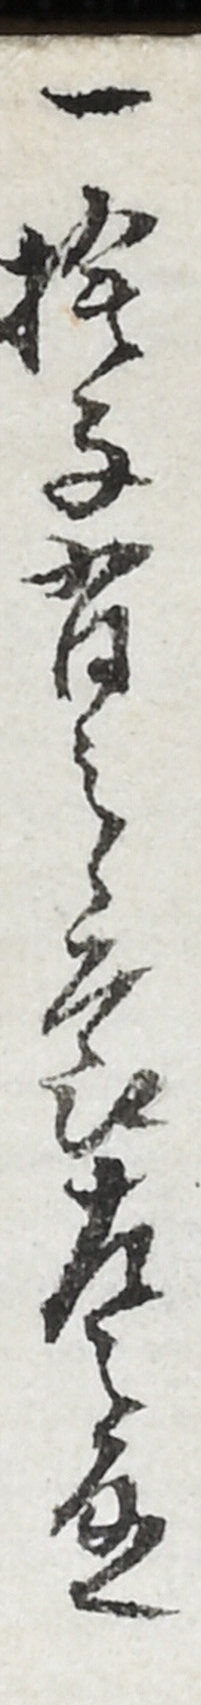一捨子有之候節左之通
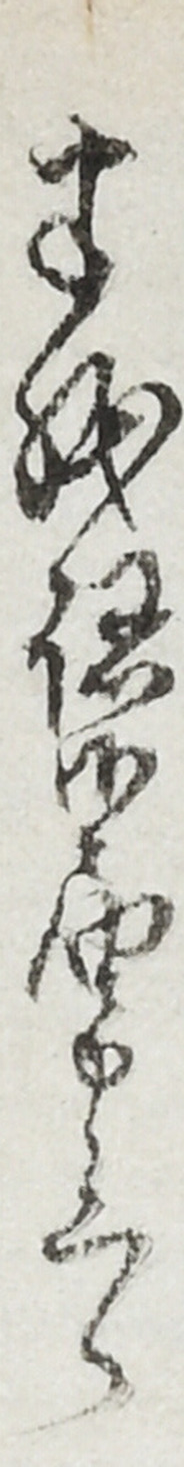半紙認御届申上候
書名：年内行事懐中録
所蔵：伊那市立高遠町図書館・合同会社AMANE
